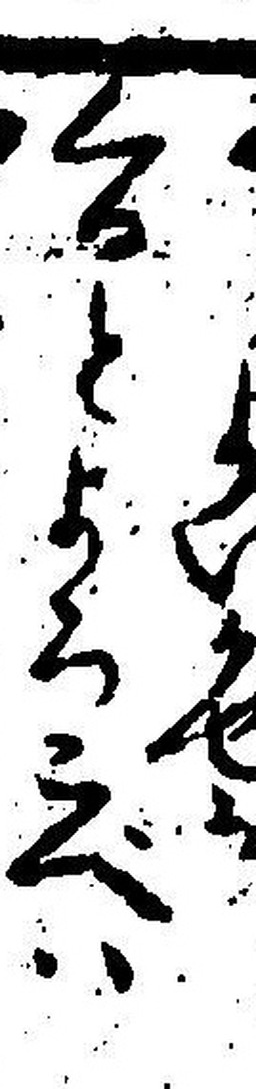くるとよろこべは
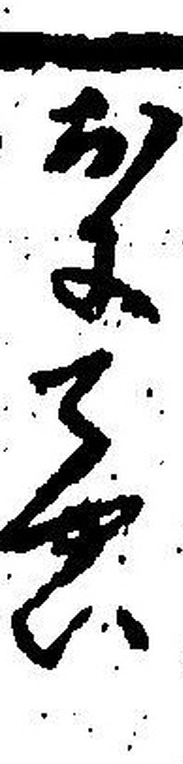おにてやい
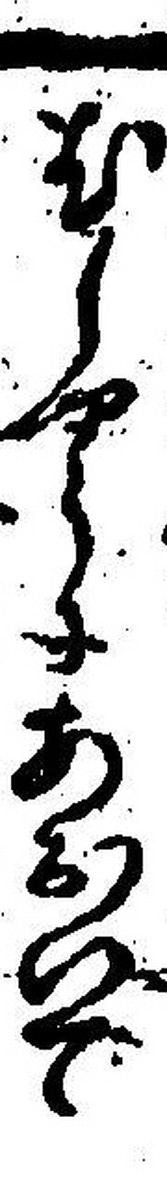むしやうにあおいて
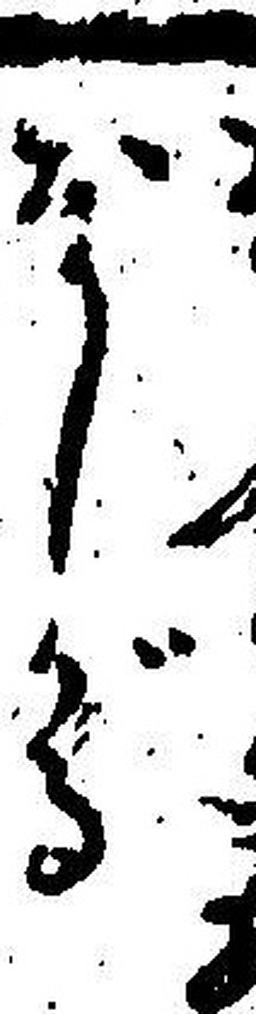おかしがる
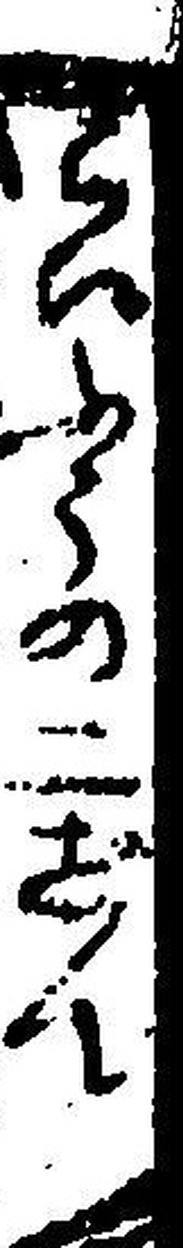らいふうの二じん
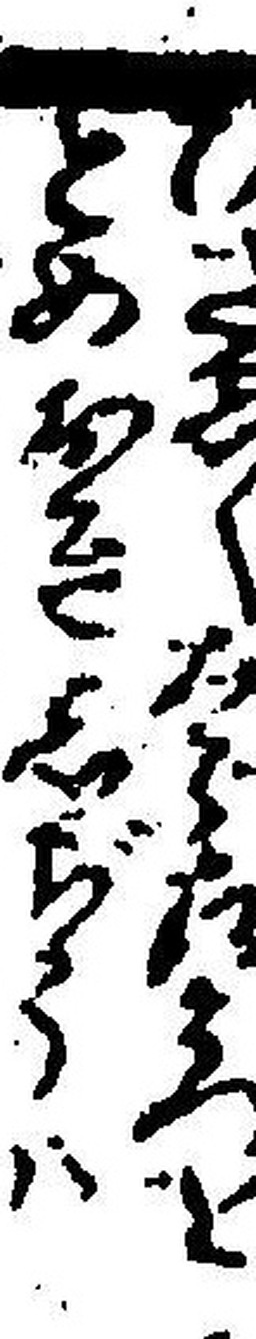とめおきしぢうは
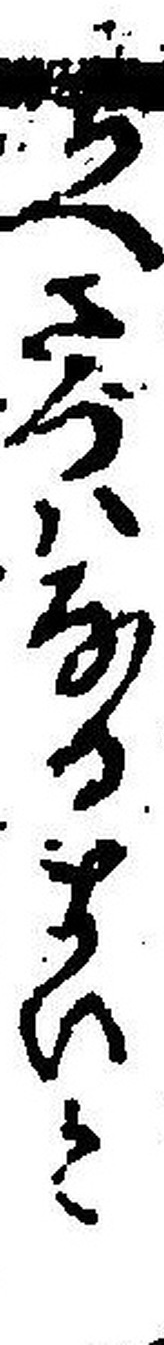かへさづはなるまいと
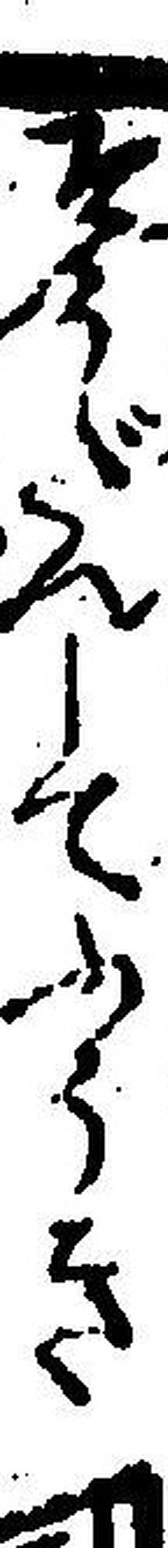そうだんしてふうき
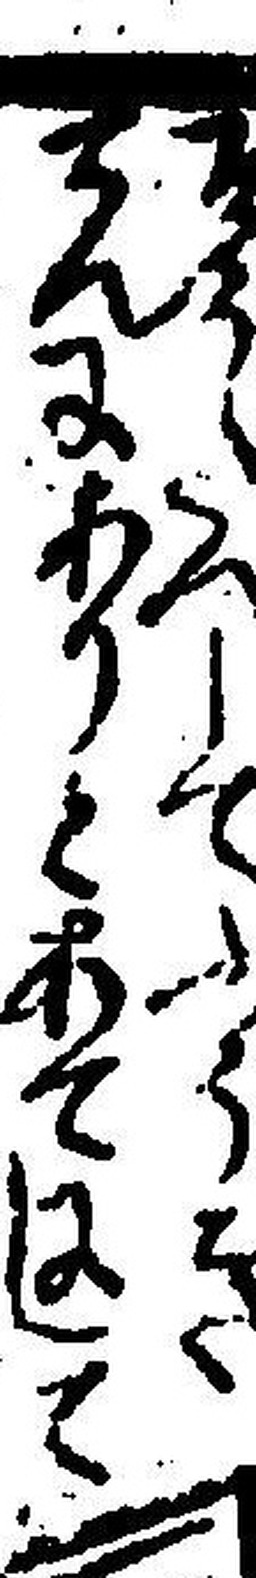てんにありとあてにして
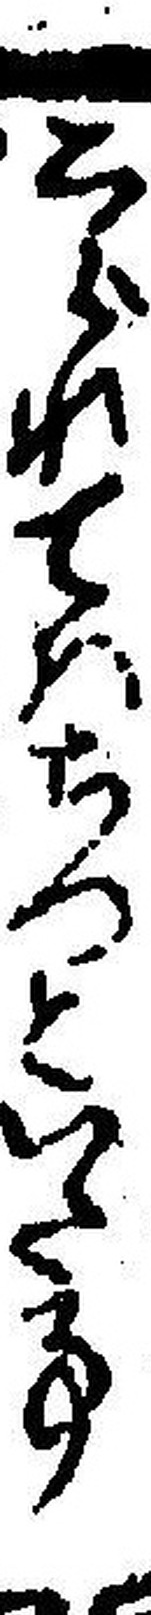こられてはちつといた事
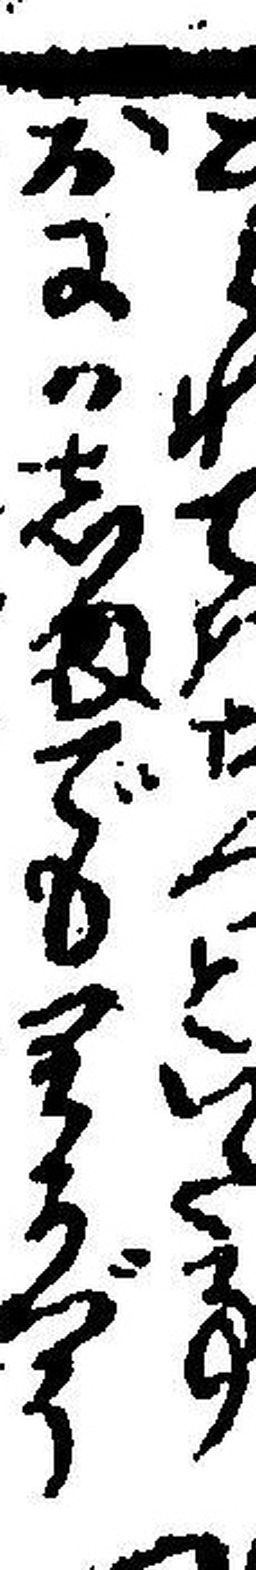おにかしまでもりうぐう
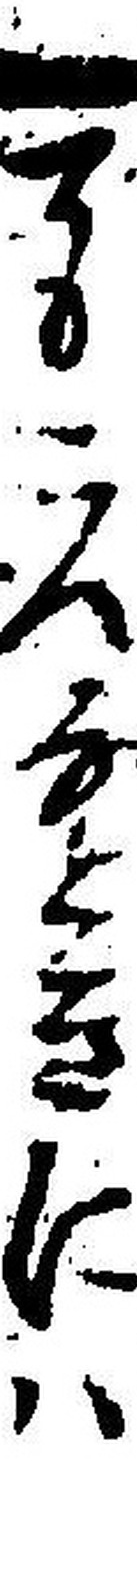でもこんなときには
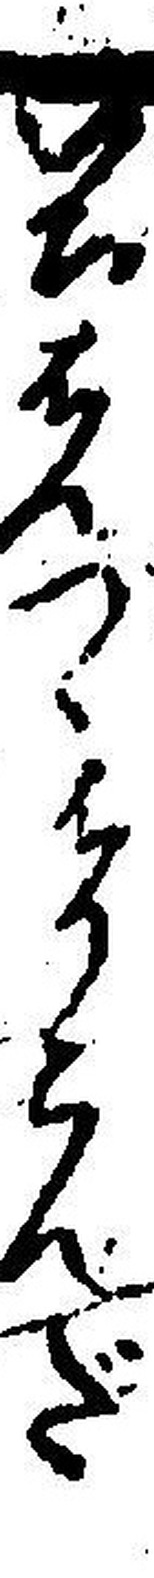いちはんづゝはりこんだ
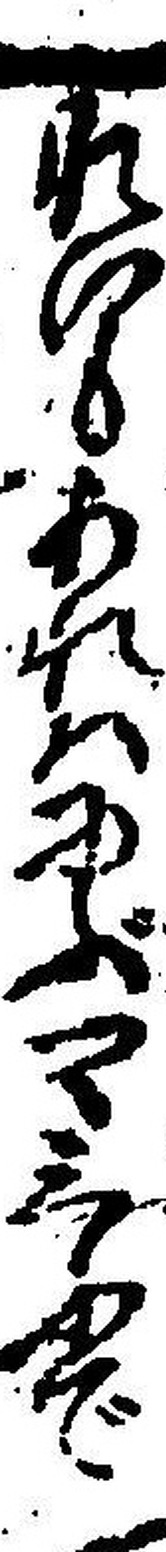れいもあれはにぶや三ふで
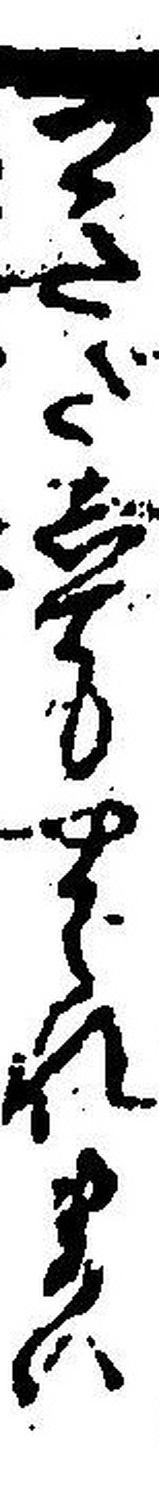つきだしてもやられまい
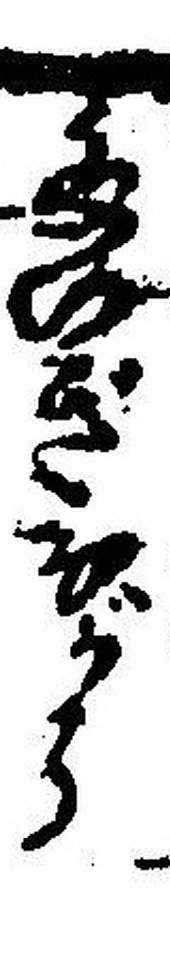たいぎながら
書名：牡丹餅棚有 / 市場通笑作
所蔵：東京大学総合図書館 General Library in the University of Tokyo, JAPAN
